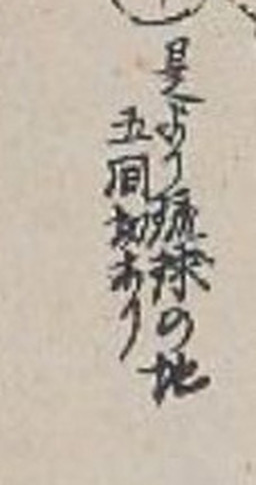五間切あり

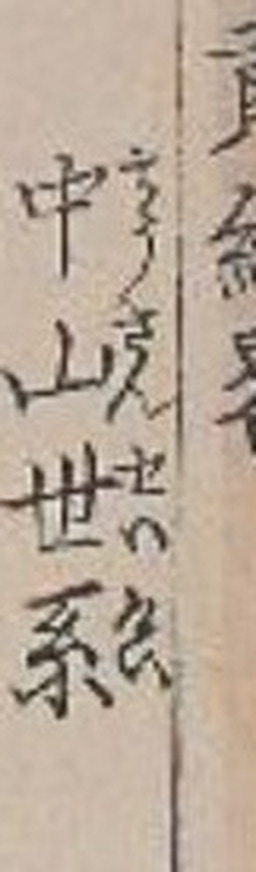中山世系
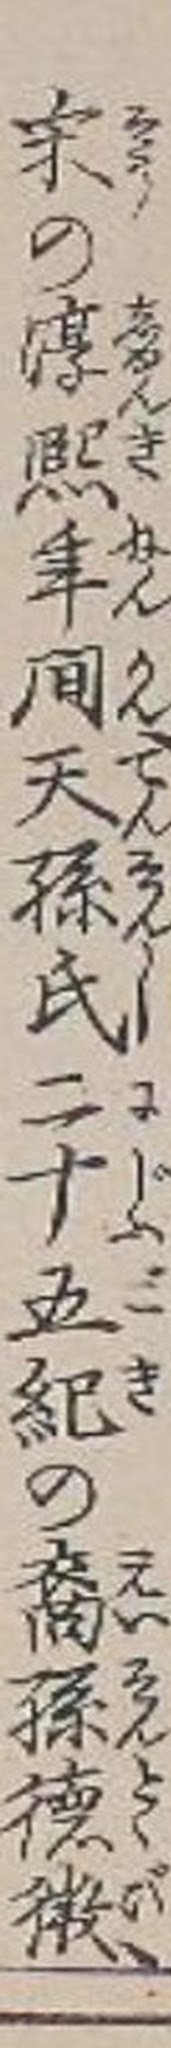宋の淳煕年間、天孫氏廿五紀の裔孫徳微、
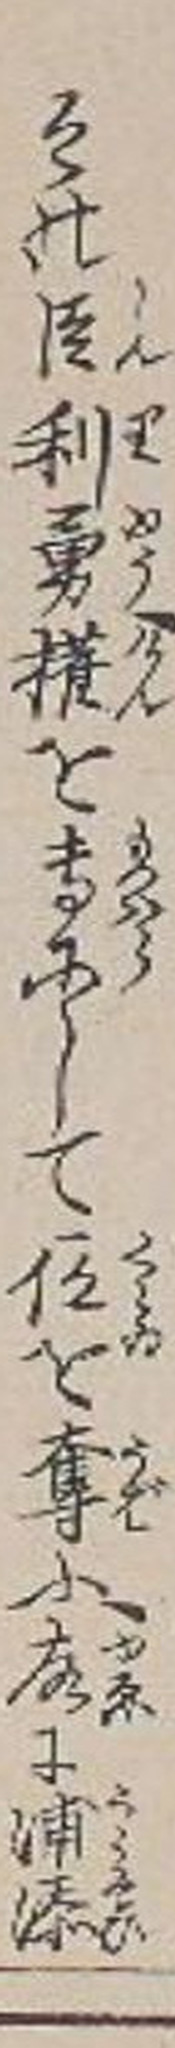その臣利勇、権を専にして位を奪ふ、故に浦添
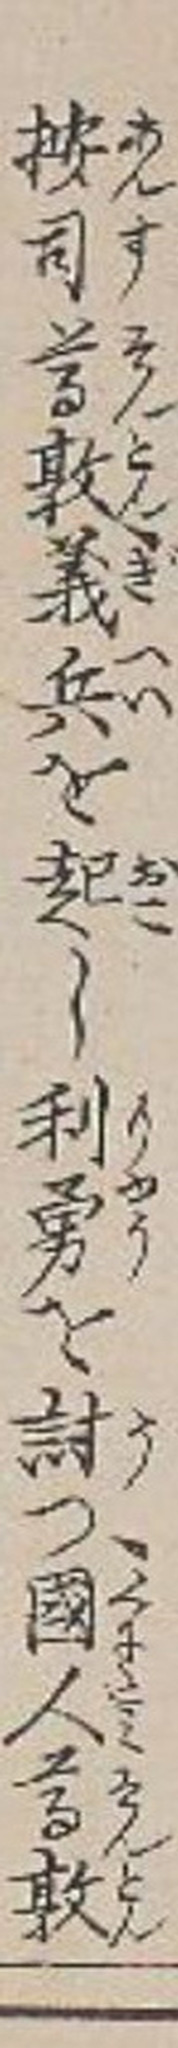按司尊敦、義兵を起し利勇を討つ、国人尊敦
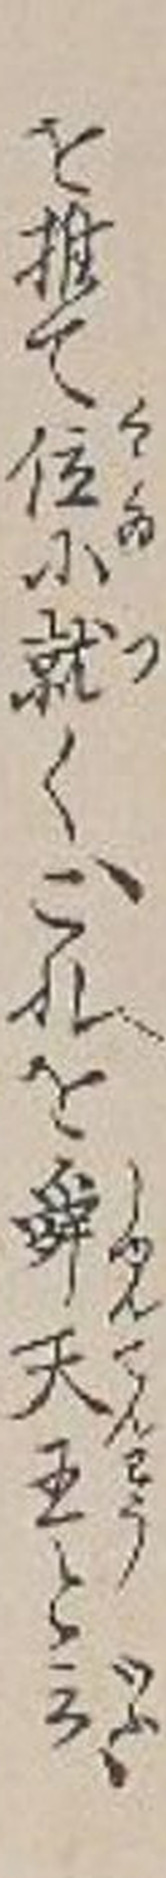を推て位に就く、これを舜天王と云、
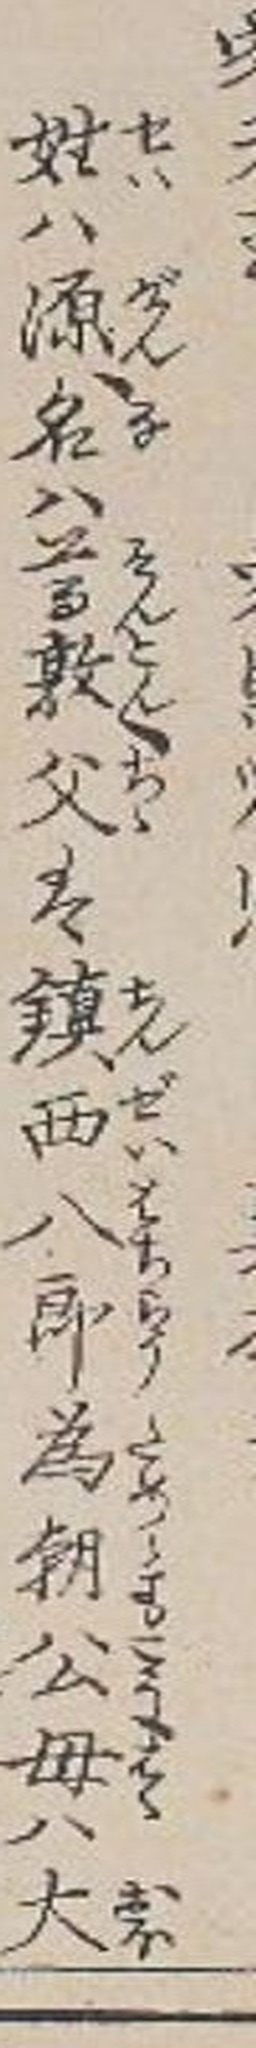姓は源、名は尊敦、父は鎮西八郎為朝公、母は大
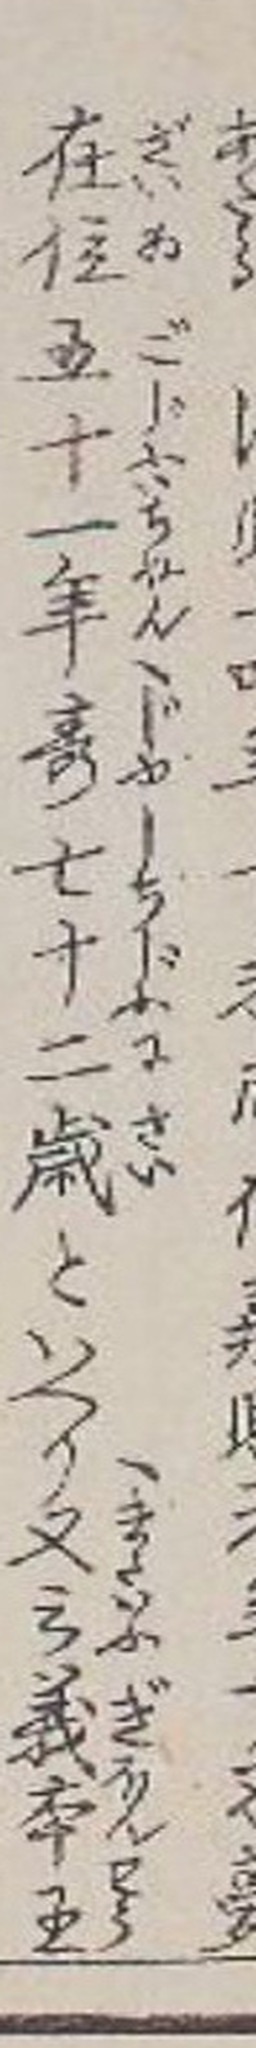在位五十一年、寿七十二歳といへり、又云義本王
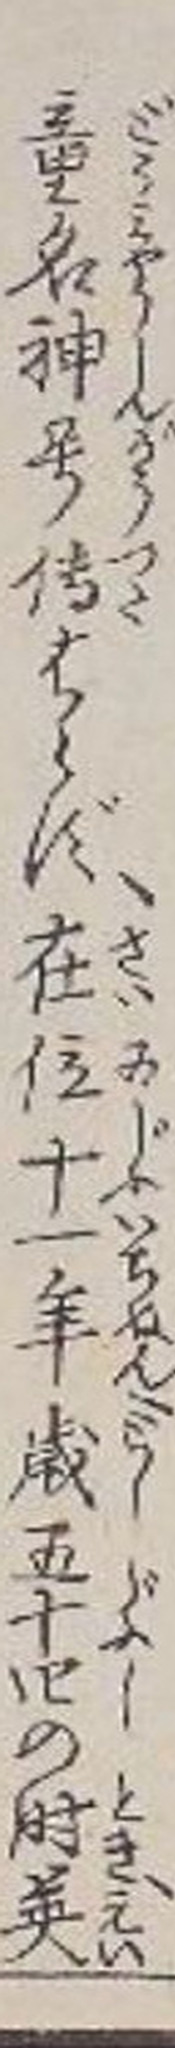童名神号伝はらず、在位十一年、歳五十四の時、英
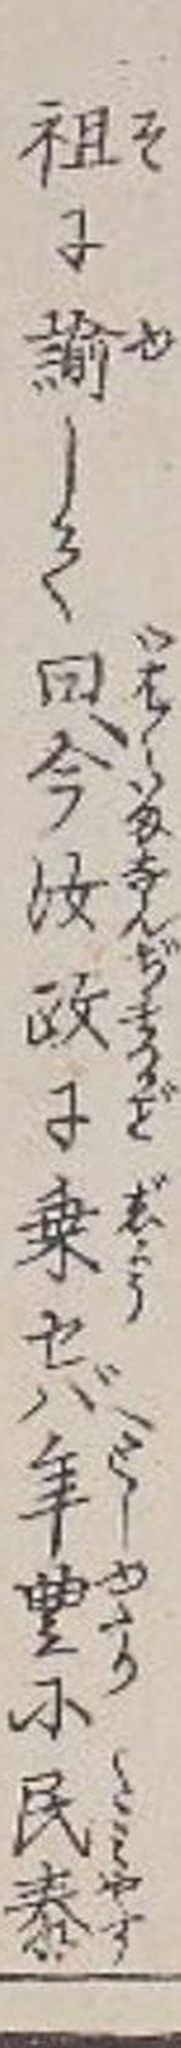祖に諭して曰、今汝政に乗せば、年豊に民泰
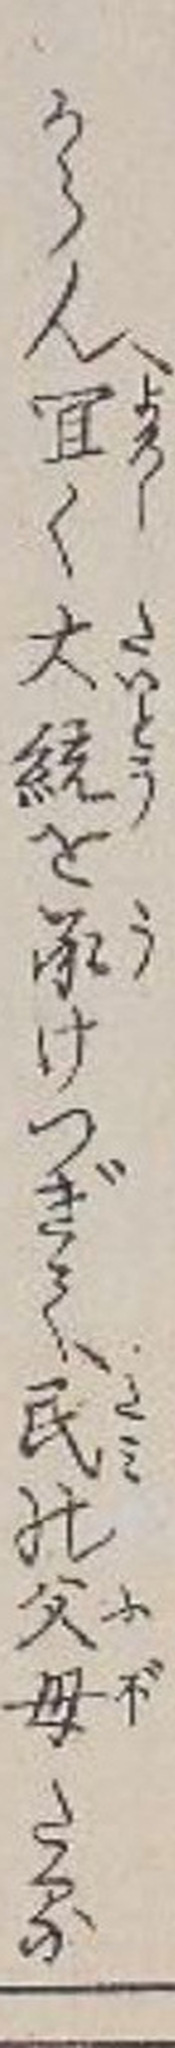からん、宜く大統を承けつぎて、民の父母たる
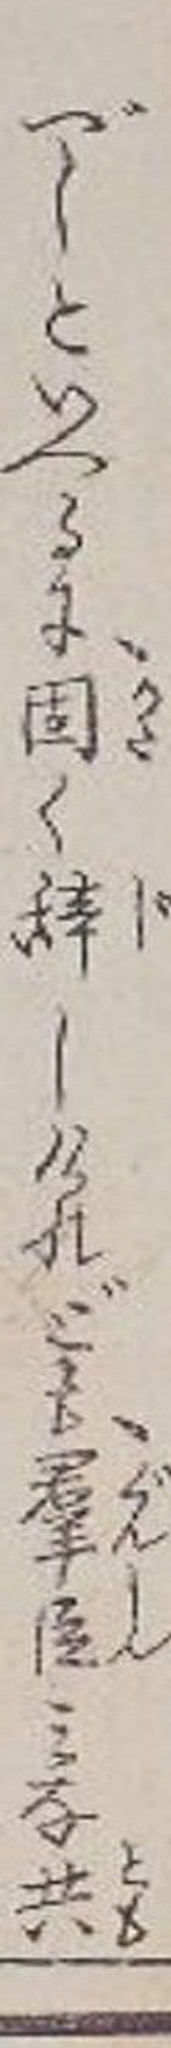べしといへるに、固く辞しけれども、群臣みな共
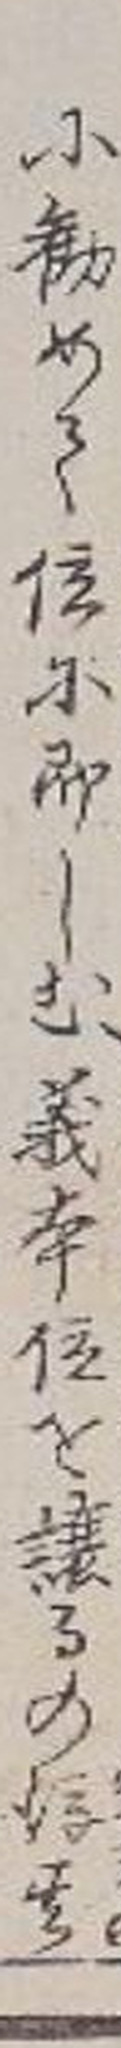に勧めて位に即しむ、義本位を譲るの後、其
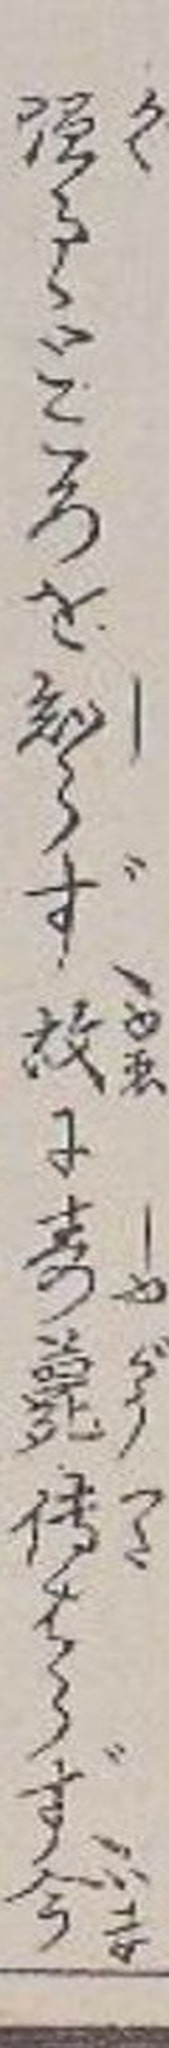隠るゝところを知らず、故に寿薨伝はらず、今

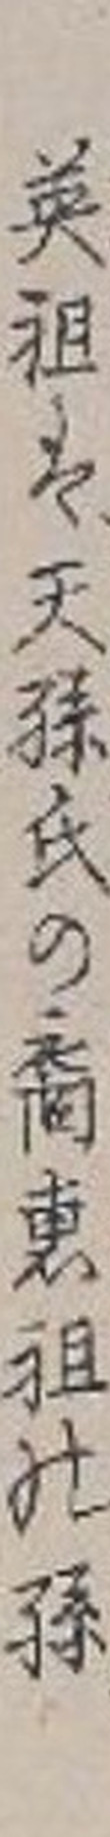英祖は、天孫氏の裔、恵祖の孫、│
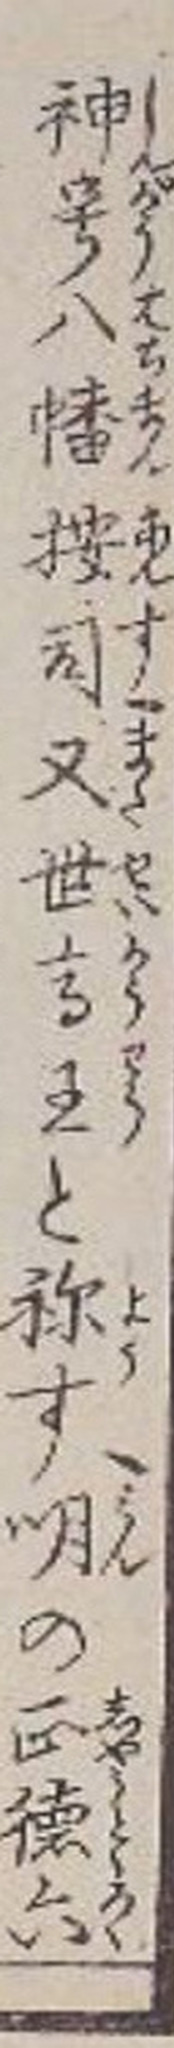神号八幡按司、又世高王と称す、明の正徳六
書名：琉球入貢紀略
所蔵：University of the Ryukyus Library
